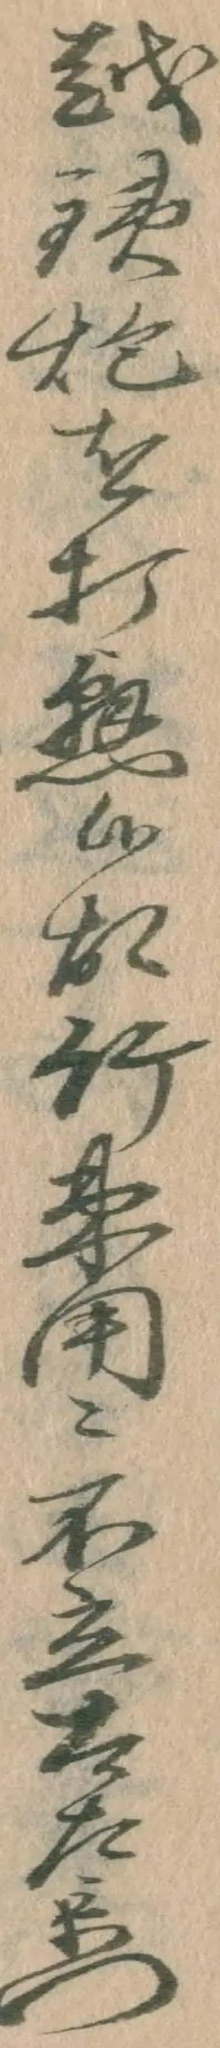越鉄砲を打懸候故竹束用に不立太左衛門
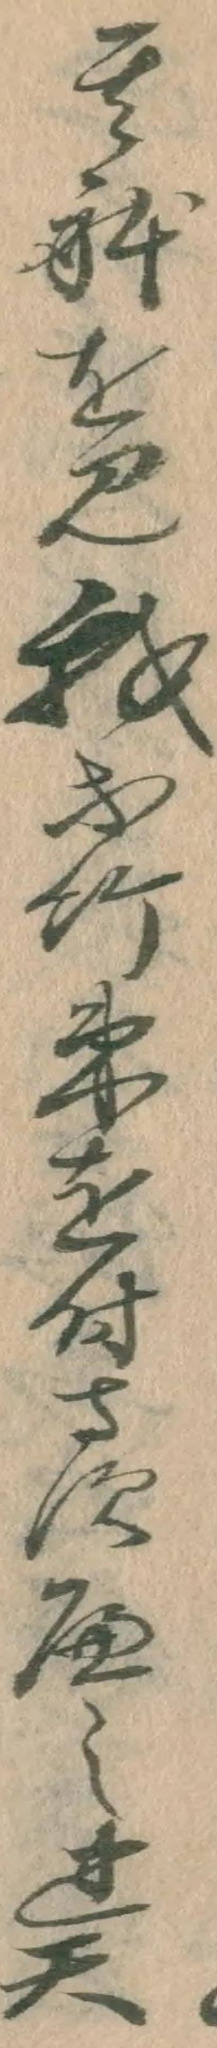其躰を見我等竹束を付さ須扁し迚天
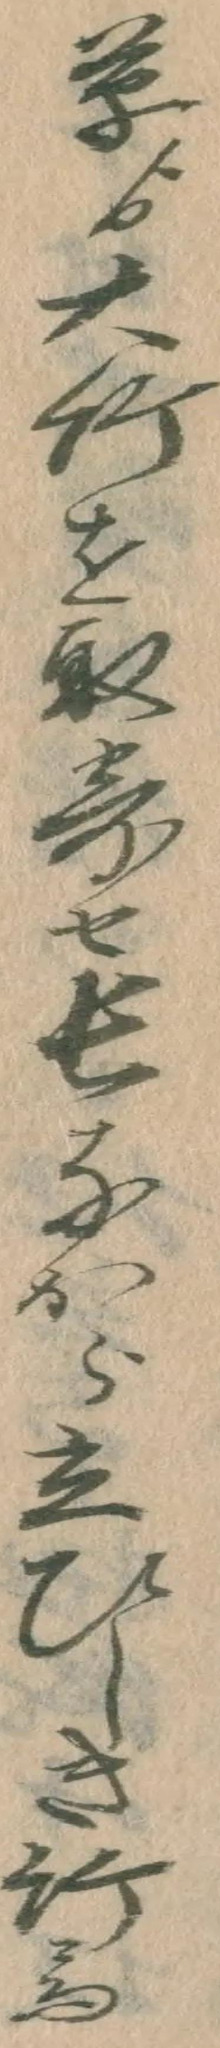草ゟ大竹を取寄せ長なから立ひしき竹に而
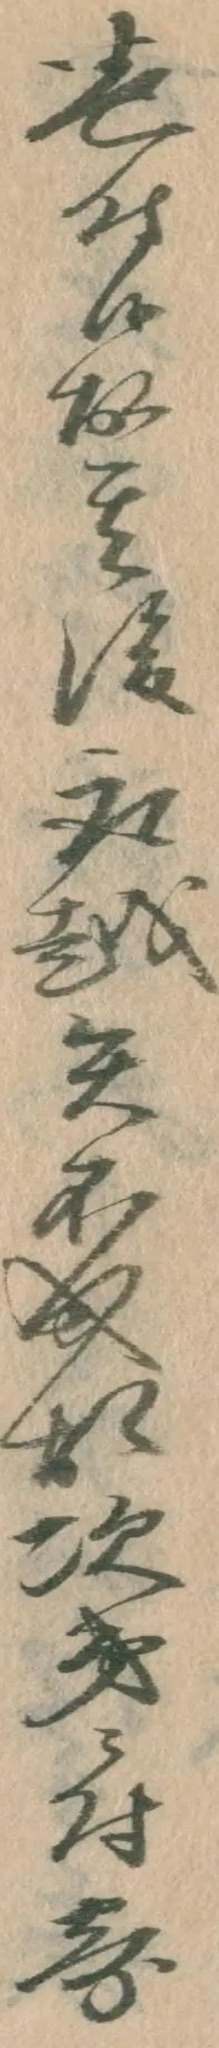巻付候故其後取越矢不成故次第に付寄
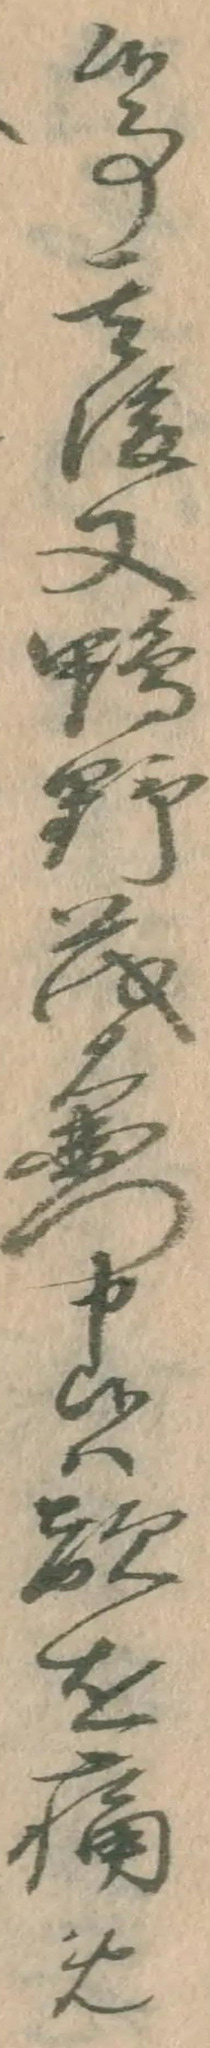候事其後又鴨野茂右衛門申候は敵を痛免
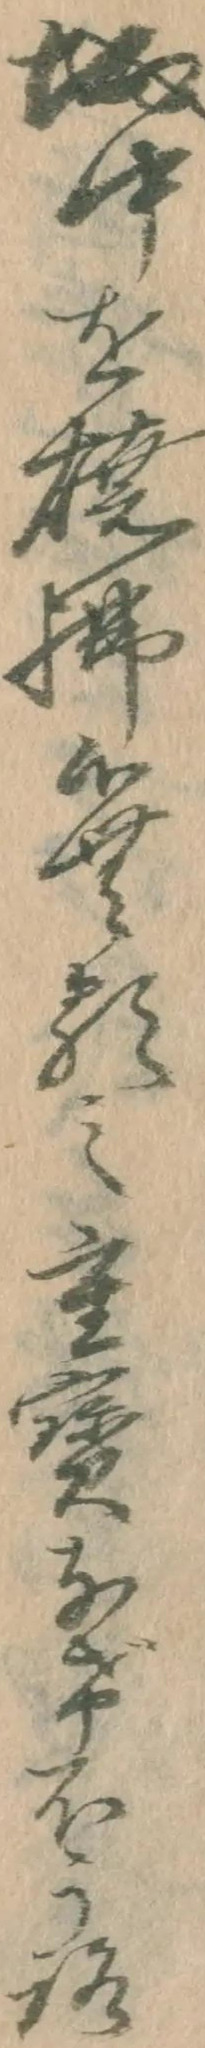城中を焼払候無類之重宝な希不う路

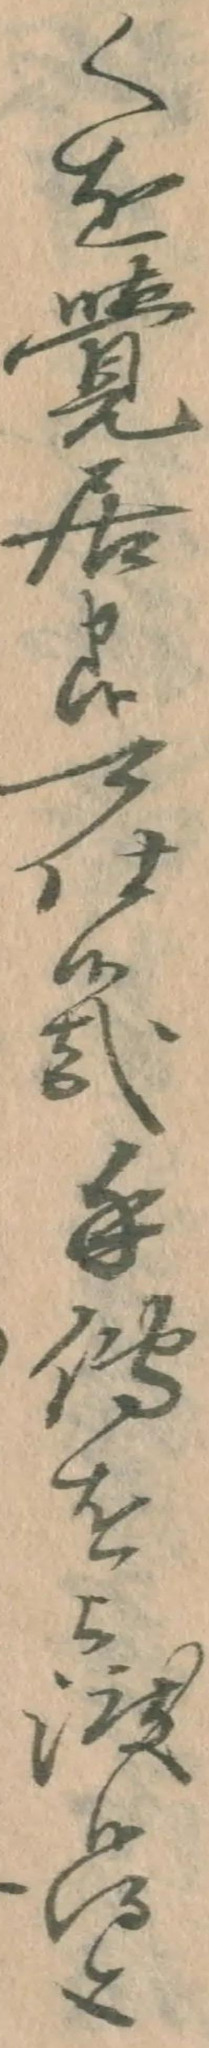くを覚居申候可仕候哉手伝を被渡候得と
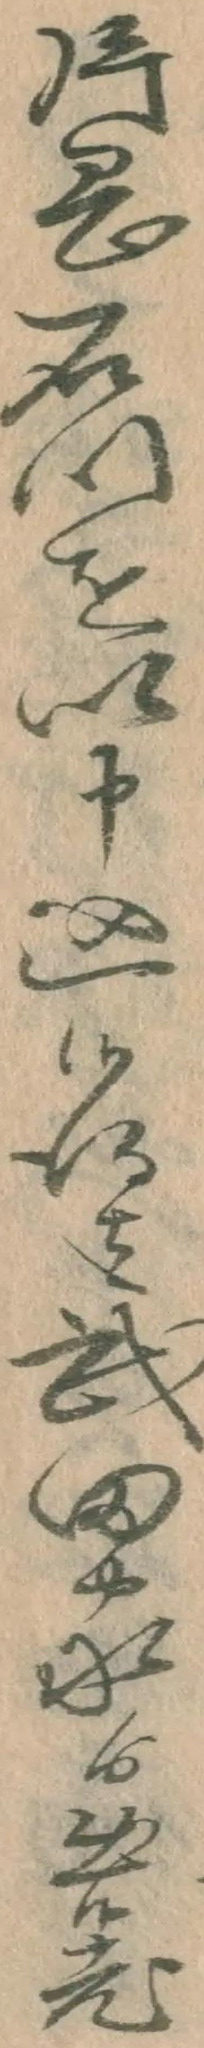片岡石川を以申込候得者武田家ゟ出候老
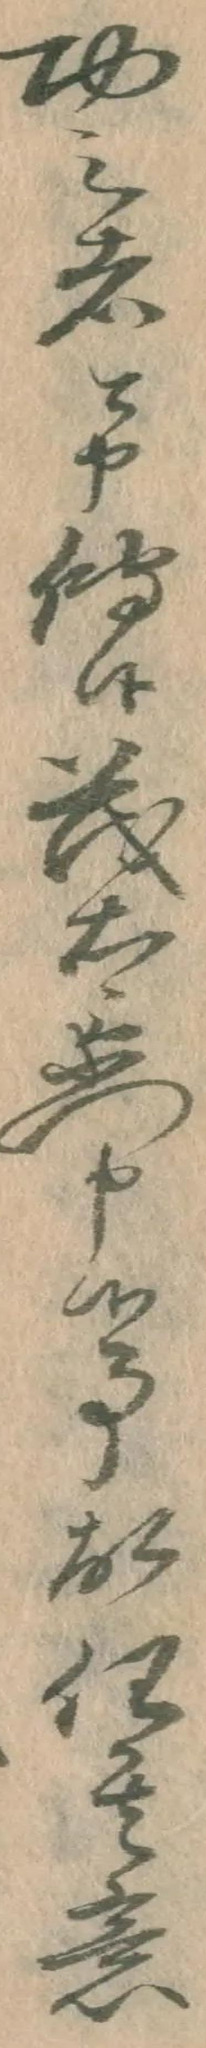功之者被申伝候茂右衛門申候事故任其意
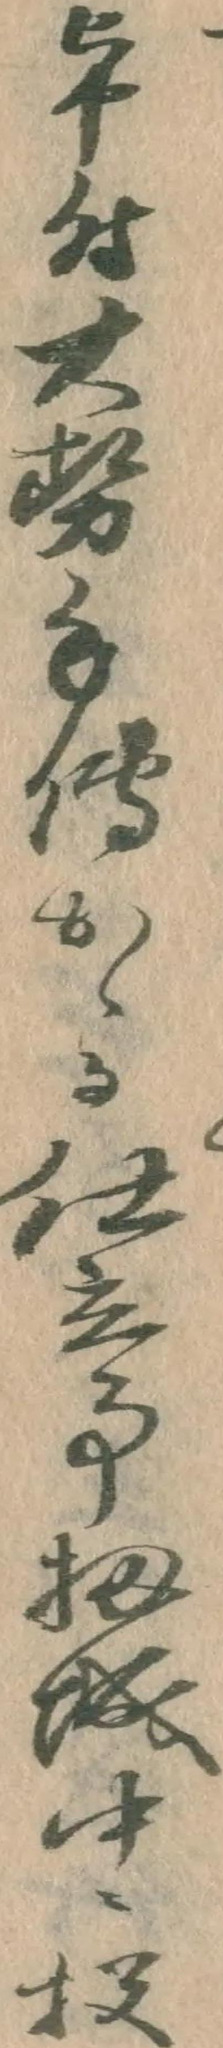被申付大勢手伝かゝる仕立事扨城中に投
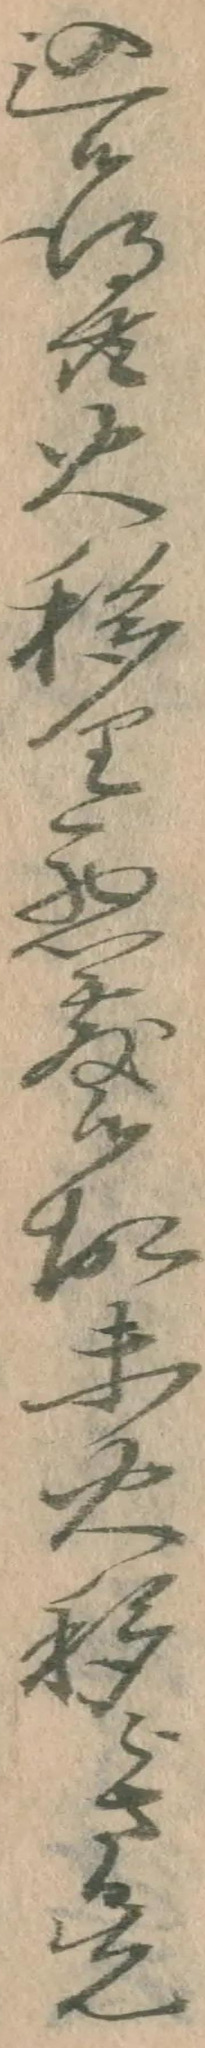込候得共火移里悪敷候故未火移らさる先
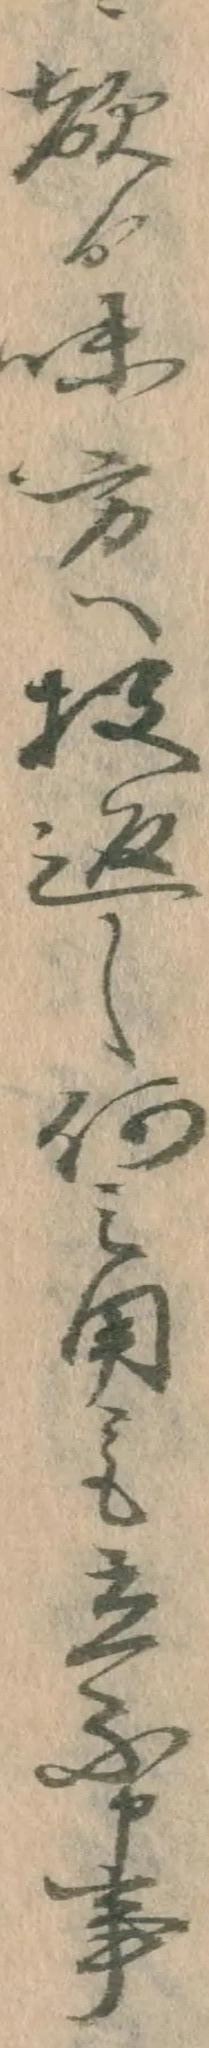に敵ゟ味方へ投返し何之用にも立ふ申事
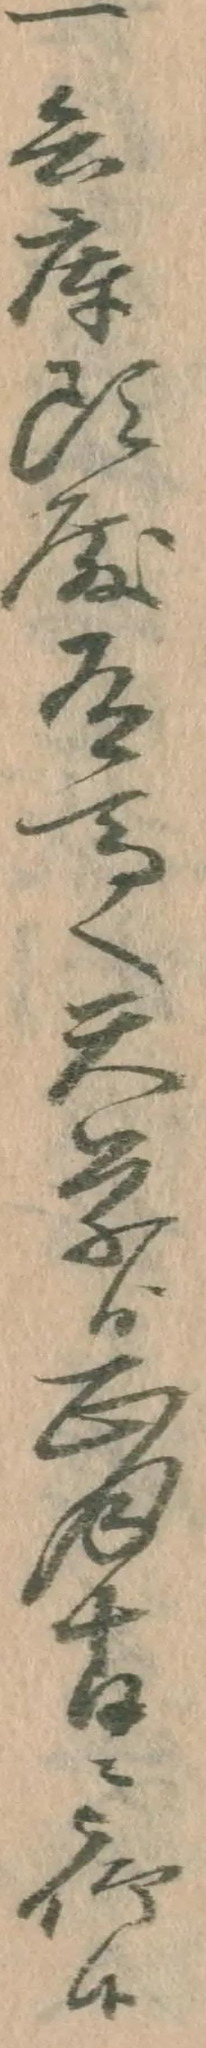一兵庫頭殿有馬へ天草ゟ正月十日に非被仰候
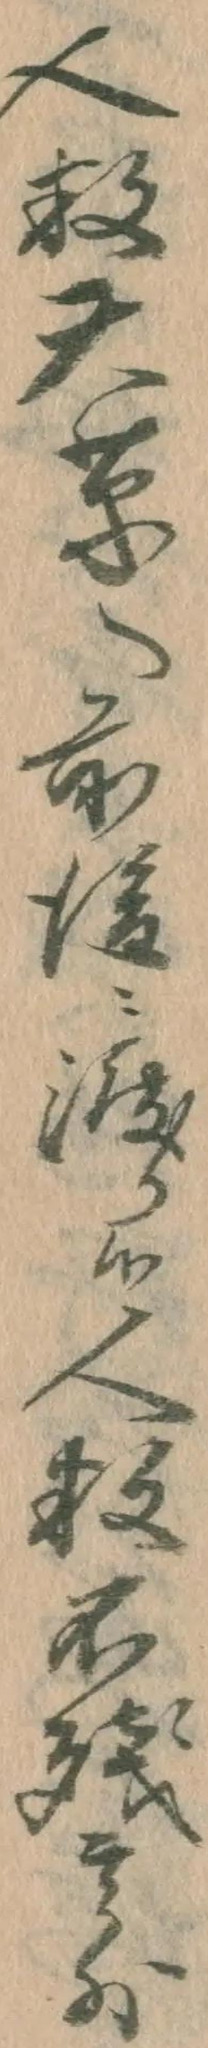人数天草へ前後に渡り候人数不残其外
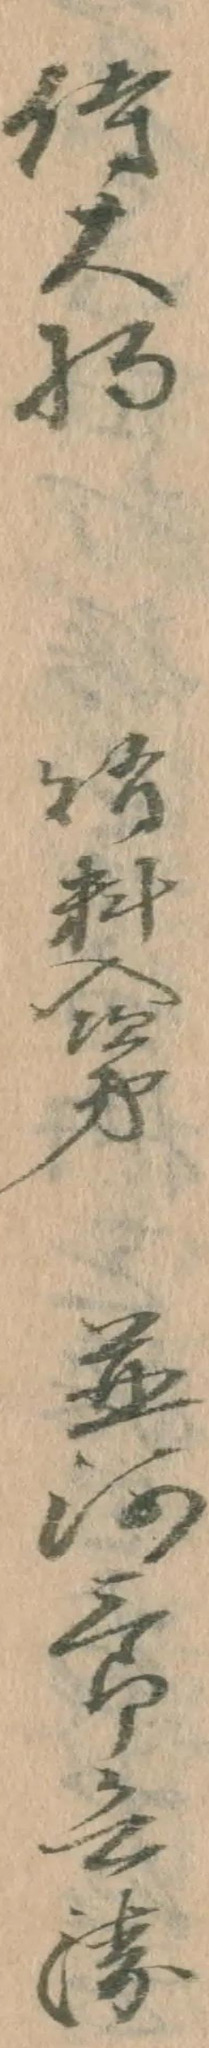侍大将賄料入次第並河三郎兵衛
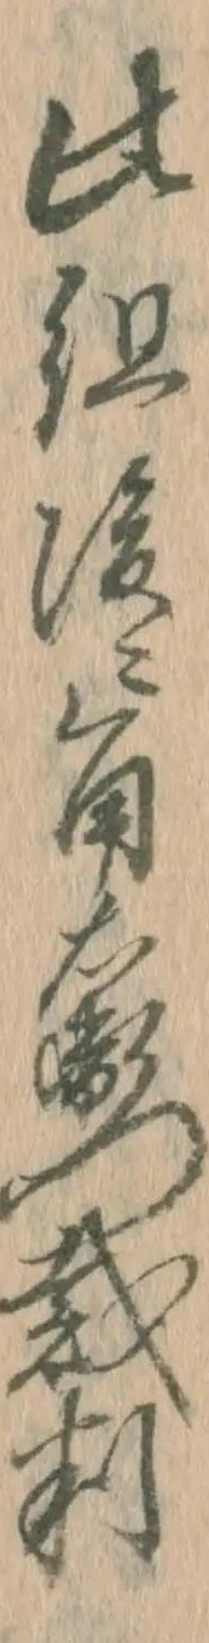此組後に角右衛門裁判
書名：切支丹御退治記 49巻. [5]
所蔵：国立国会図書館 National Diet Library, JAPAN
